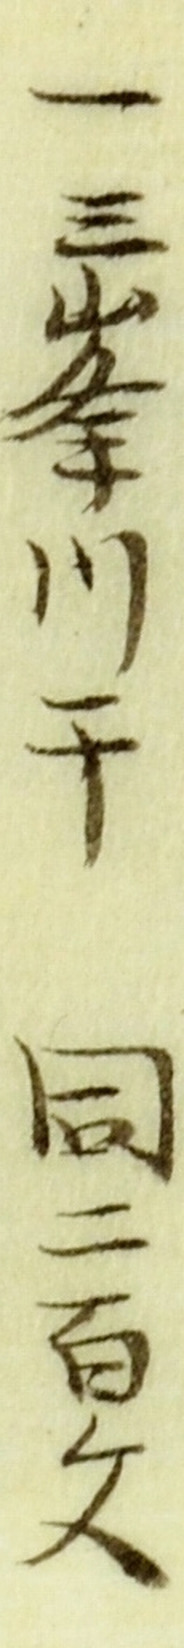一三峯川干同二百文
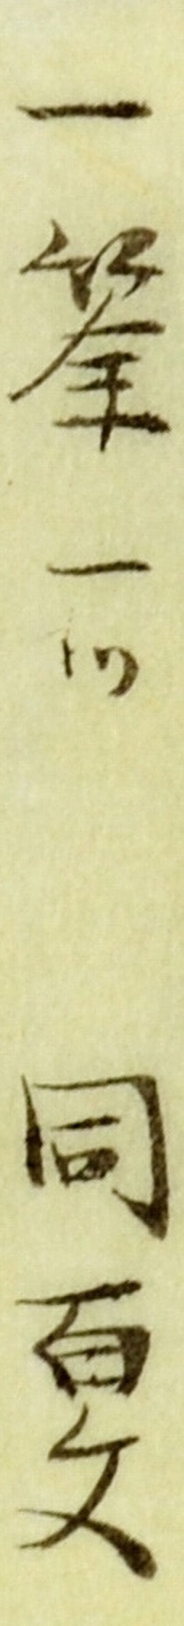一筡一ツ同百文

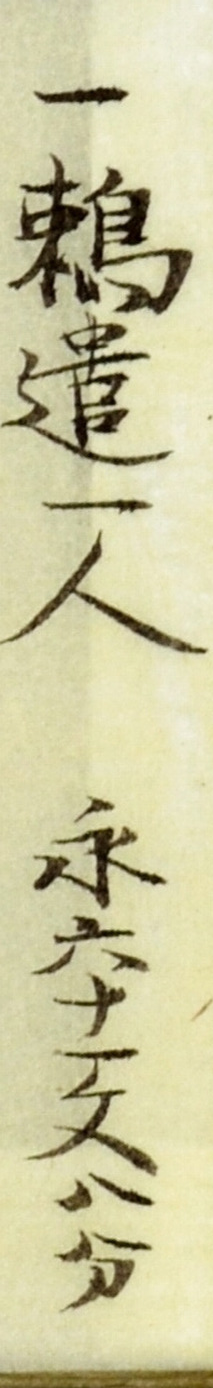一鵜遣一人永六十一文八分
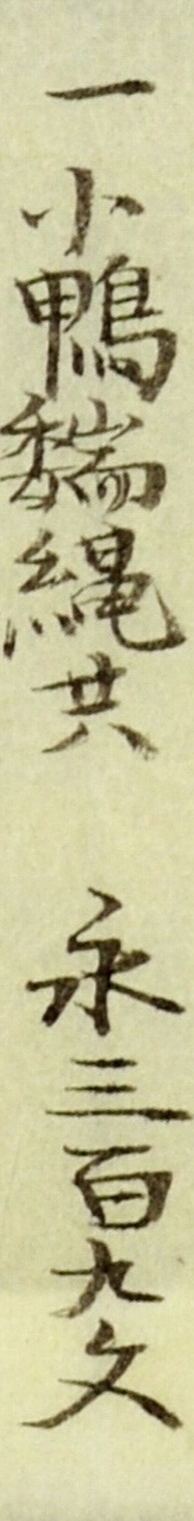一小鴨縄共永三百九文
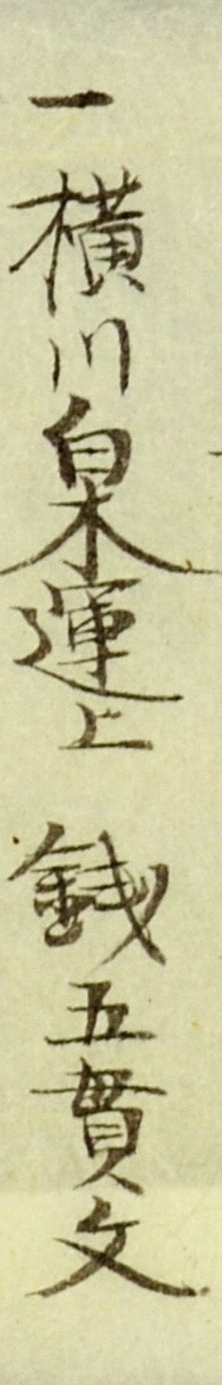一横川白木運上銭五貫文
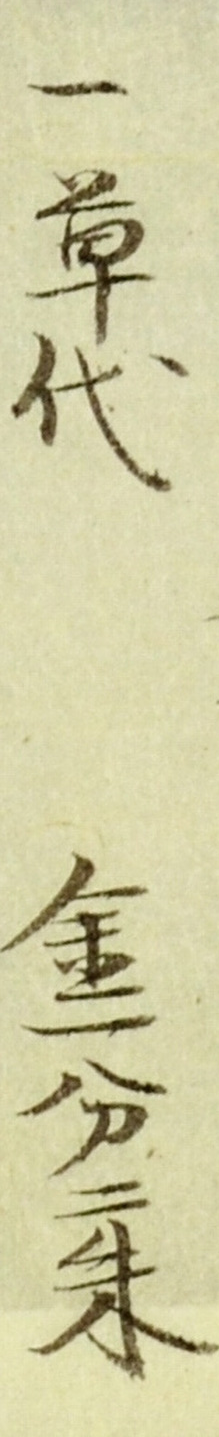一草代金一分二朱
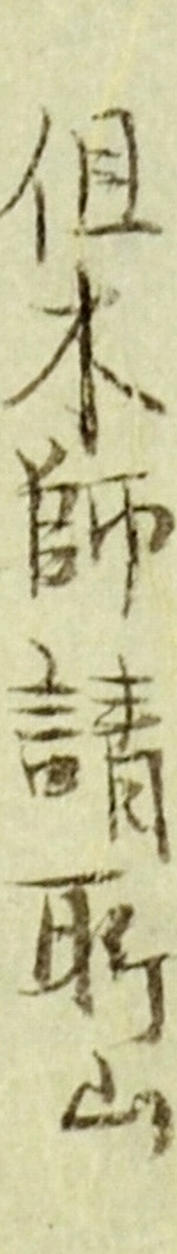但木師請取山
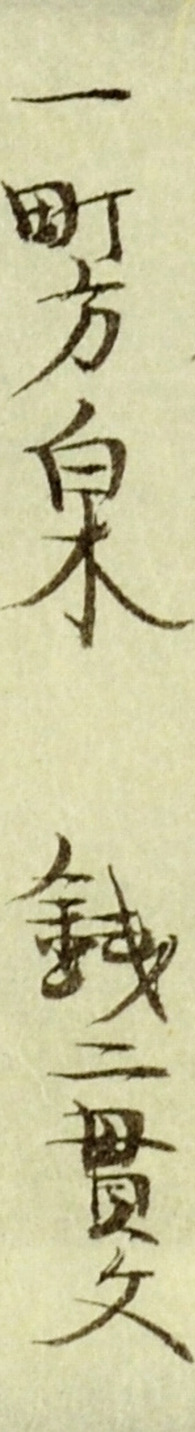一町方白木銭二貫文
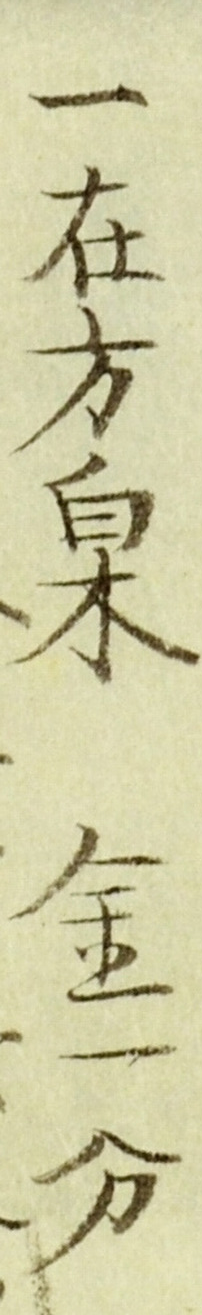一在方白木金一分
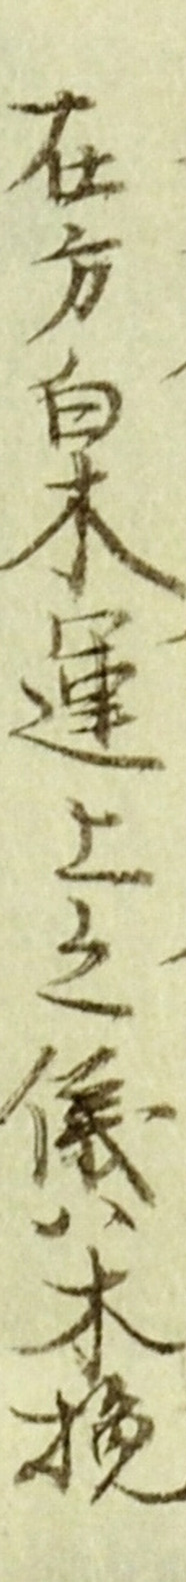在方白木運上之儀ハ木挽
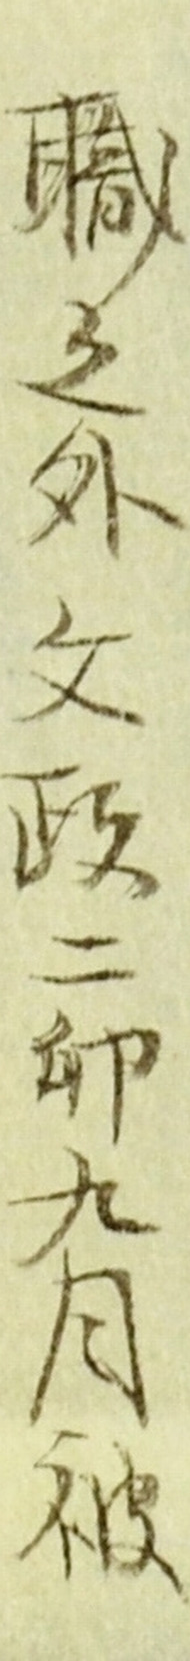職之外文政二卯九月被
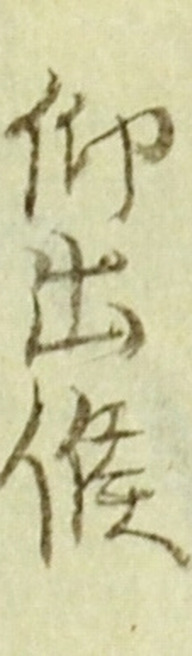仰出候
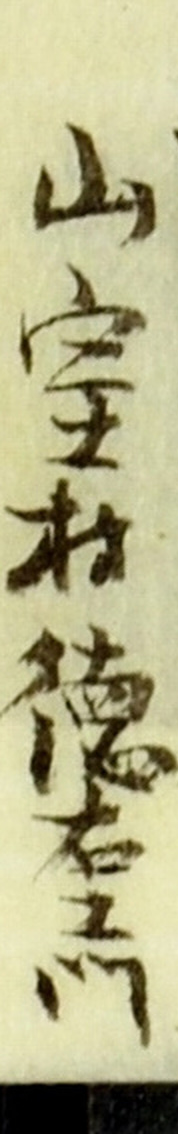山室村徳右エ門
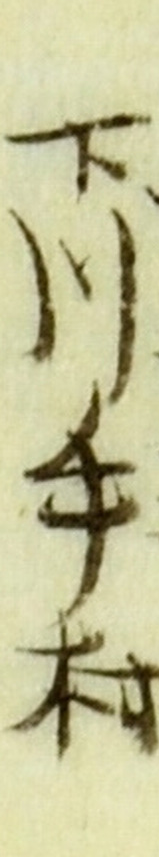下川手村
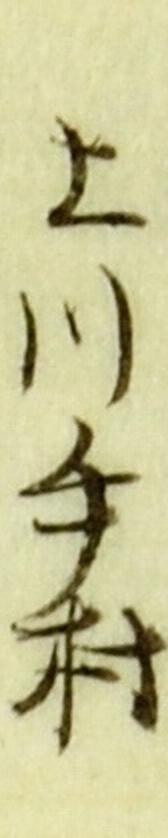上川手村
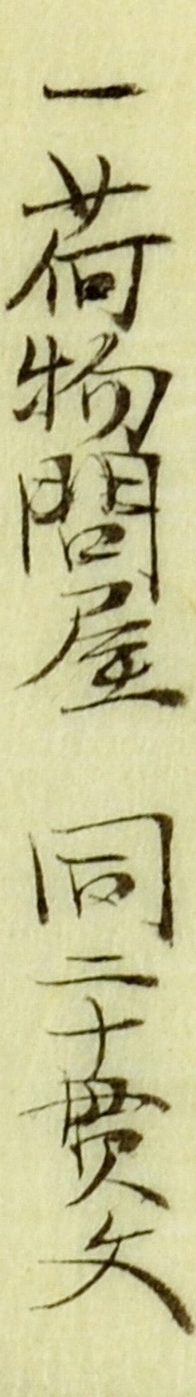一荷物問屋同二十貫文
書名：分一御定法
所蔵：伊那市立高遠町図書館・合同会社AMANE
